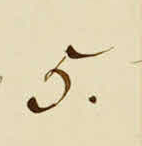5.
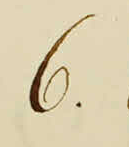6.
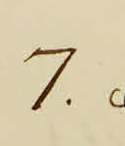7.
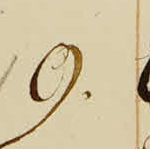9.
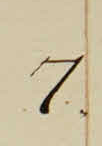7
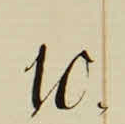10
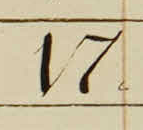17
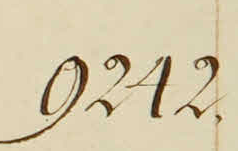9242
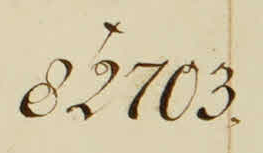82703
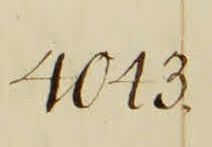4043
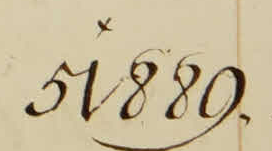51889
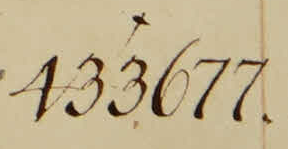433677
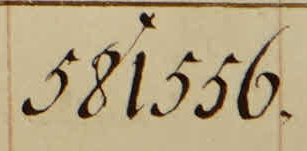581556
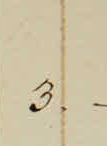3.
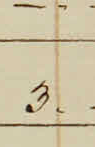3.
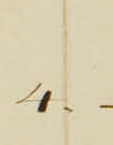4.
